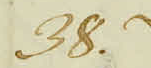38.
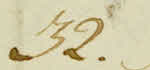32.
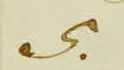5.
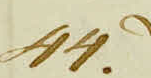44.
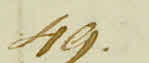49.
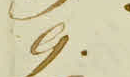9.
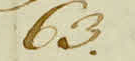63.
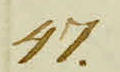47.
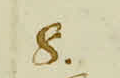8.
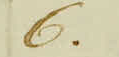6.
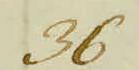36
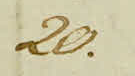20.
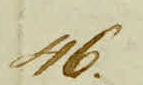46.
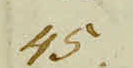45.
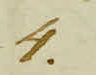4.
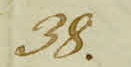38.
